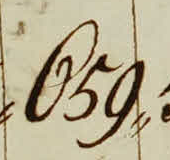659
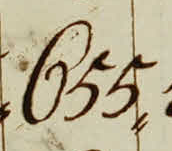655
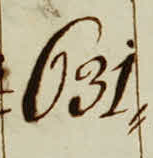631
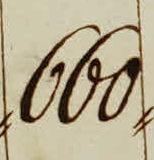660
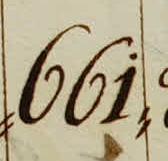661
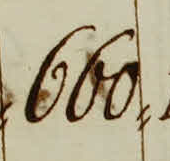660
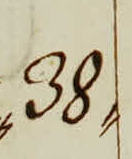38
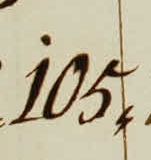105
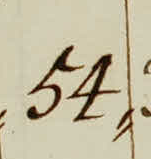54
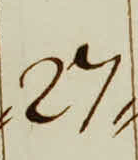27
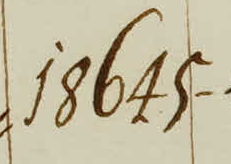18645
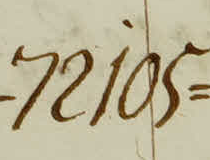72105
